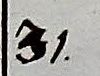31.
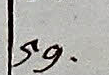59.
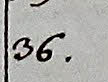36.
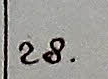28.
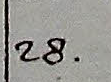28.
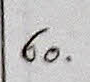60.
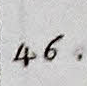46
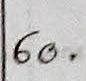60
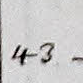43
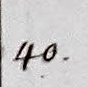40
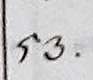53
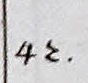42
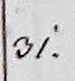31
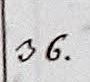36
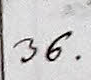36
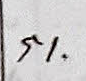51
